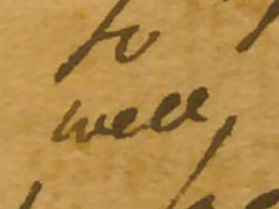well
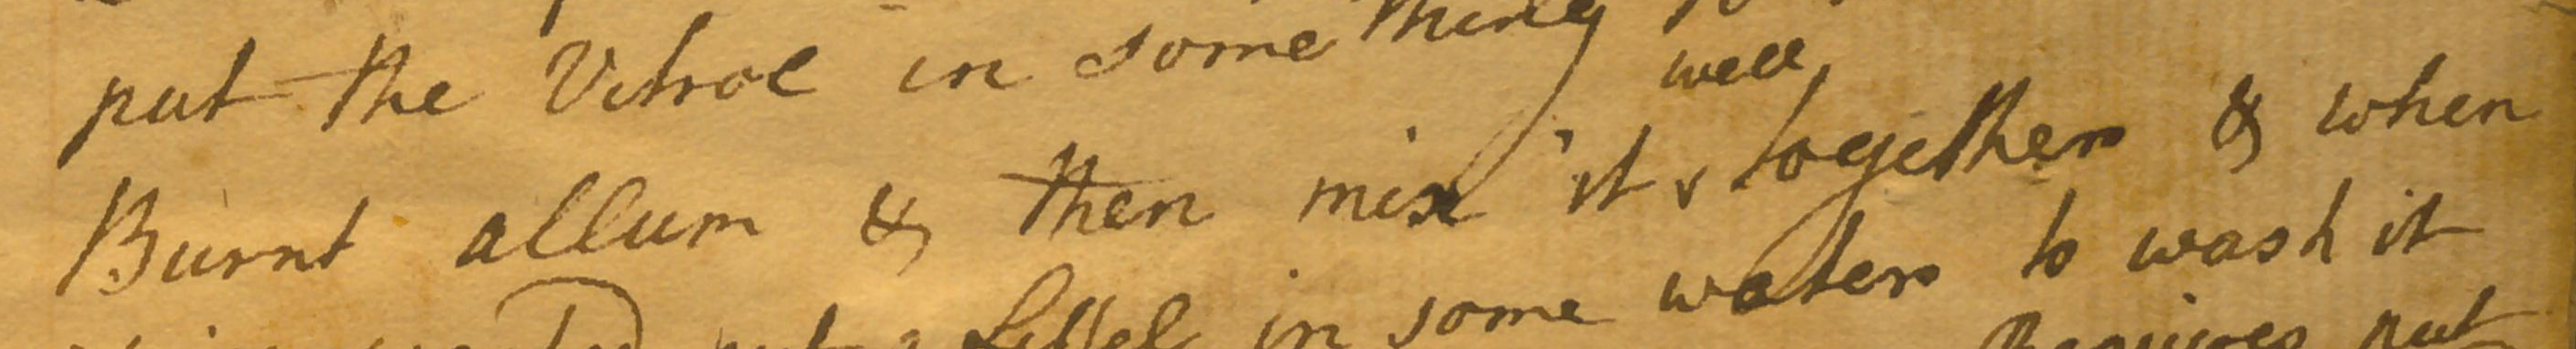Burnt allum & then mix it ^ together & when
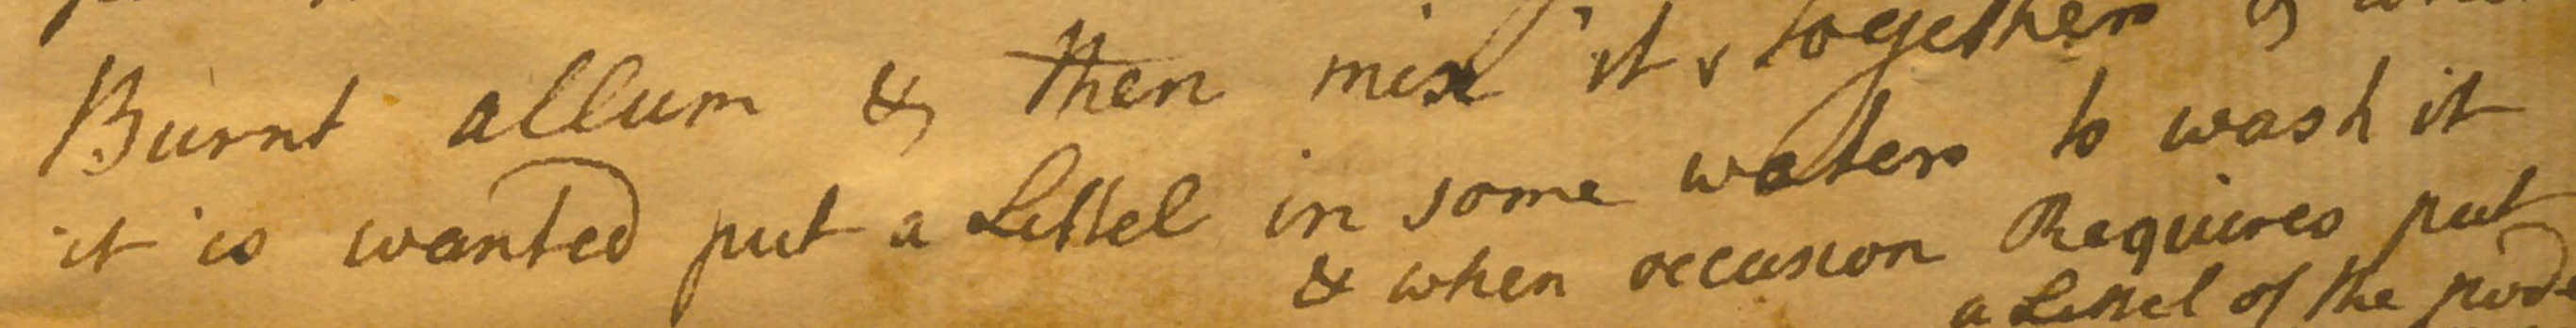it is wanted put a Littel in some water to wash it
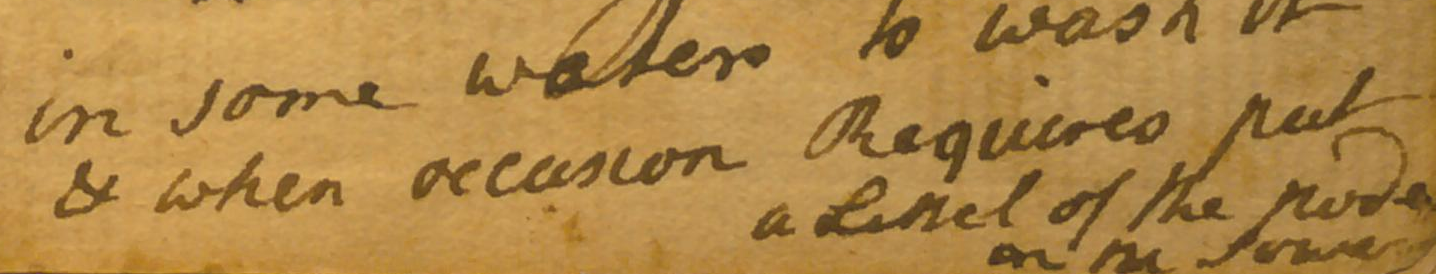& when occasion Requires put
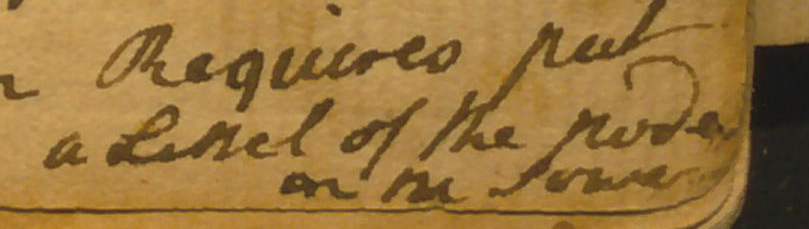a Littel of the poder
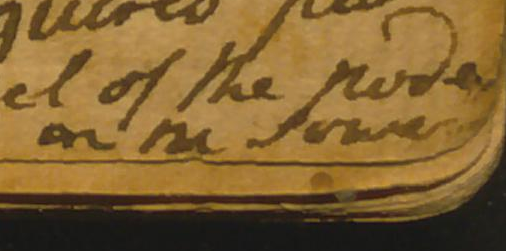on the sower
